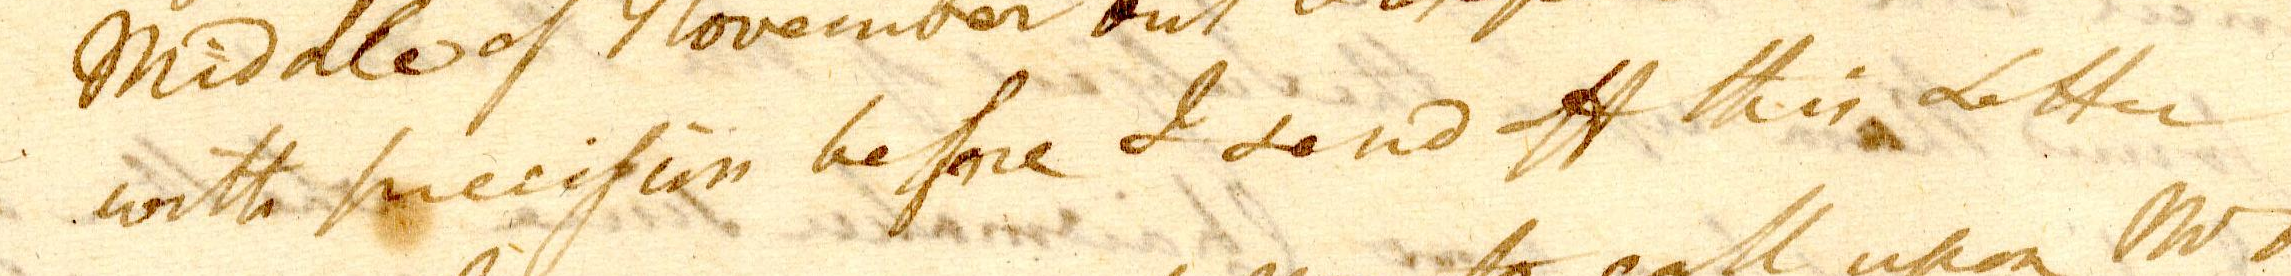with precision before I send off this Letter
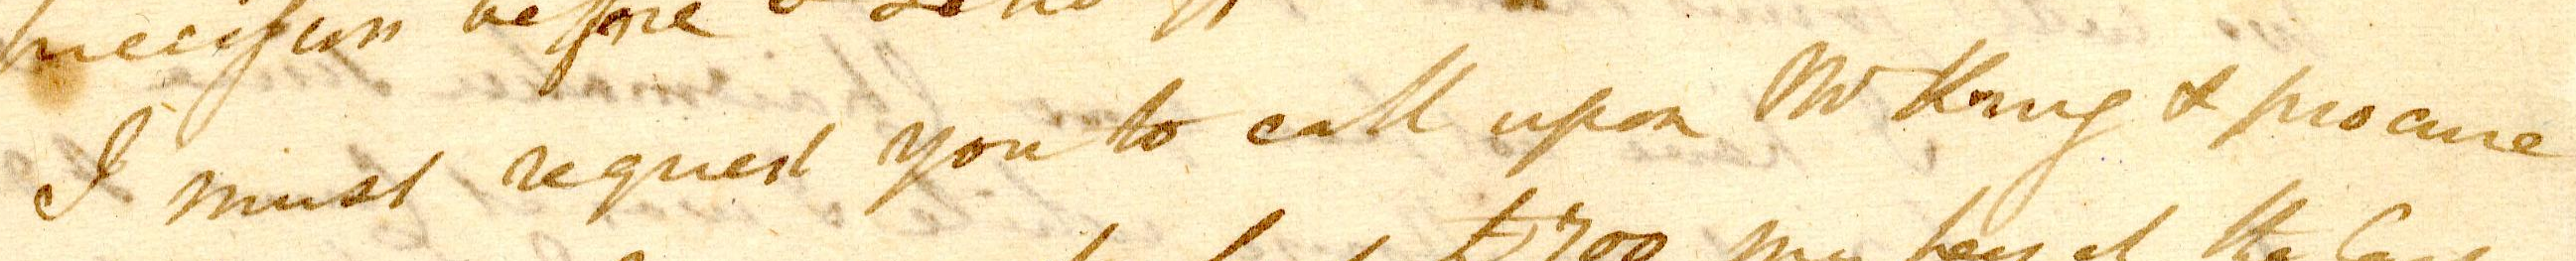I must request you to call upon M^r Krug & procure
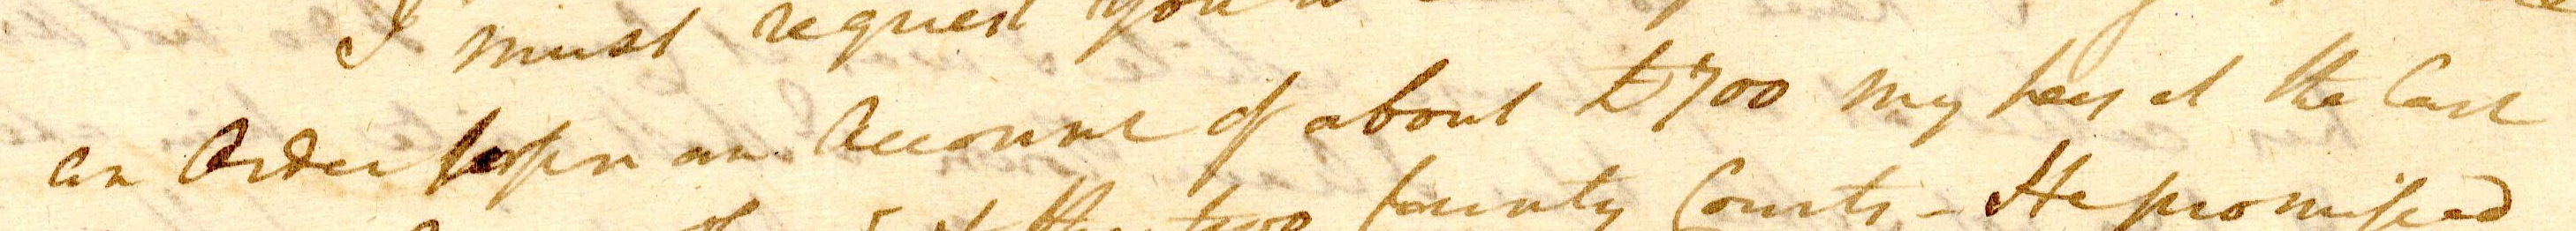an Order to open an Account of about £700 my fees at the last
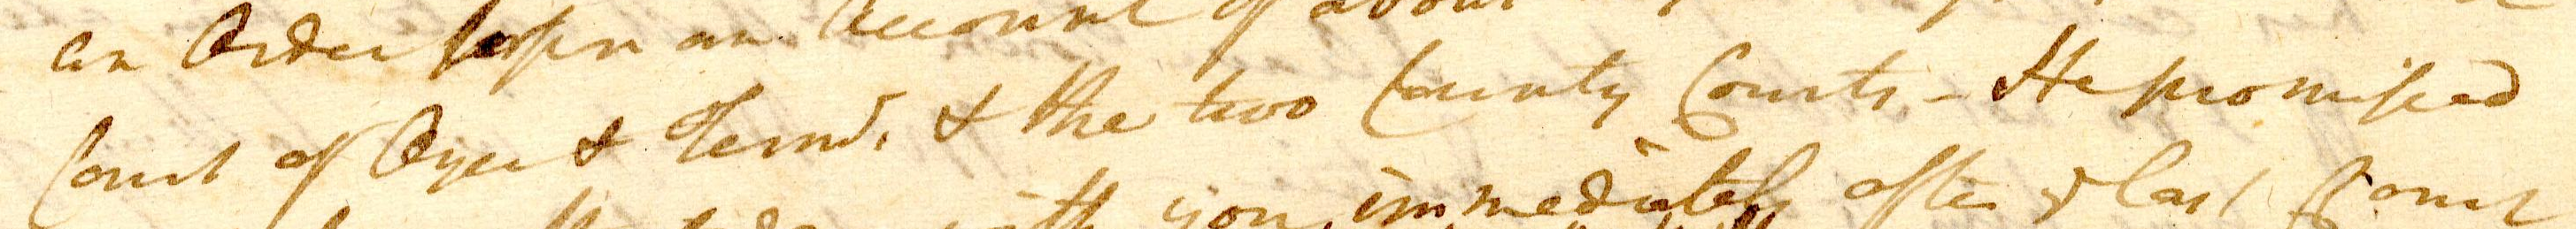Court of Oyer & Tem^r & the two County Courts. He promised
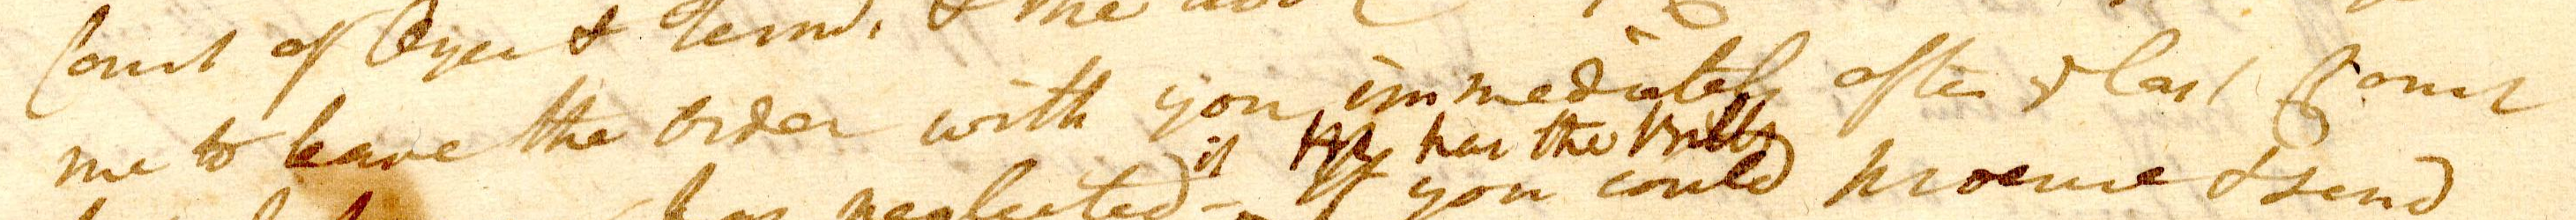me to leave the order with you immediately after y^e last Court
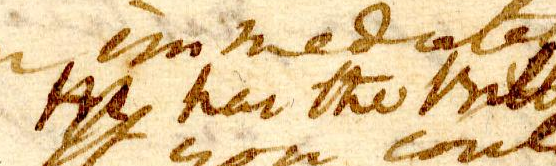it he has the Bill
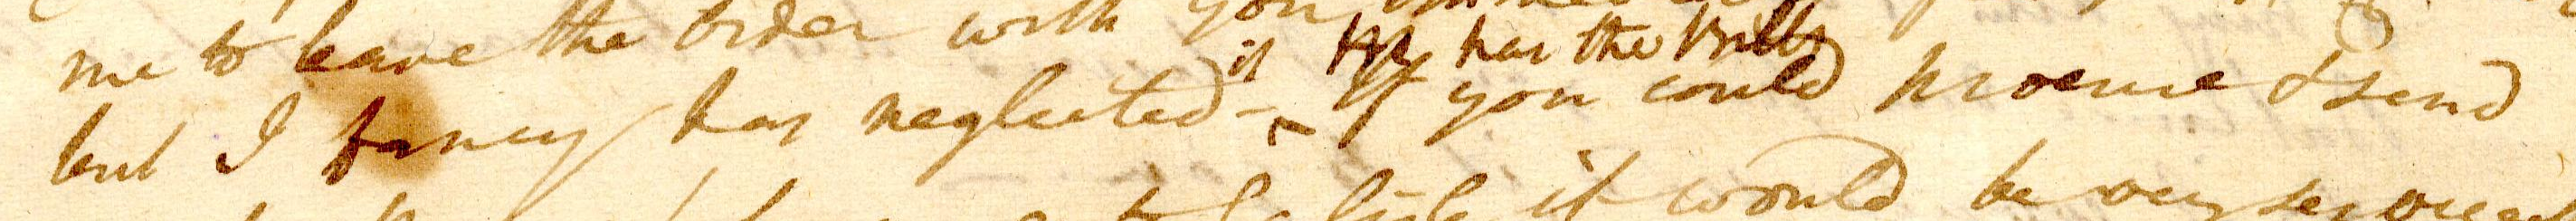but I fancy hes neglected ^ If you could procure & send
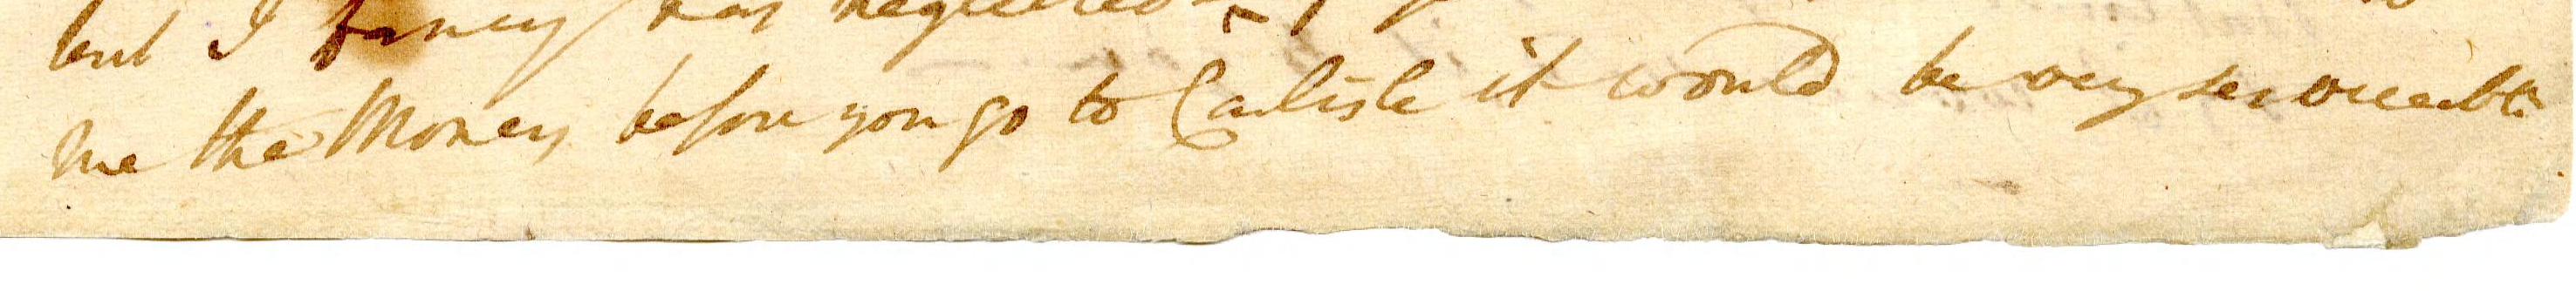me the Money before you go to Carlisle it would be very serviceable
